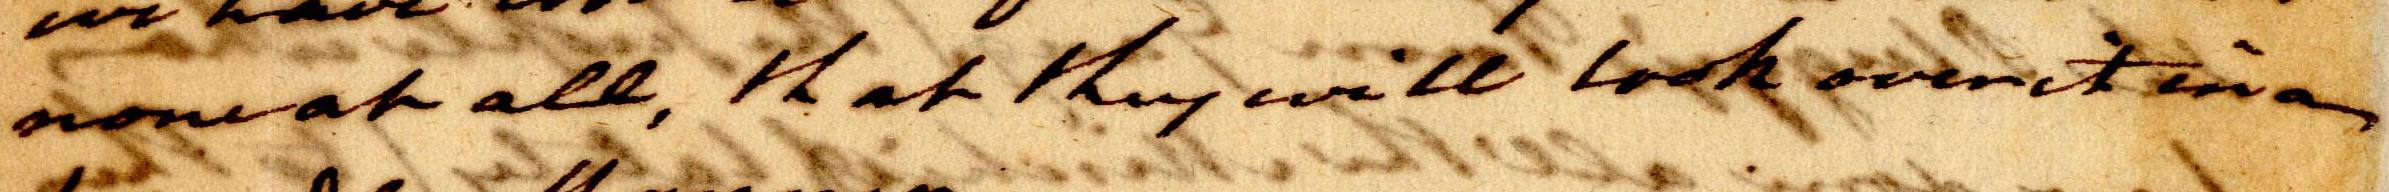none at all, that they will look over it in a
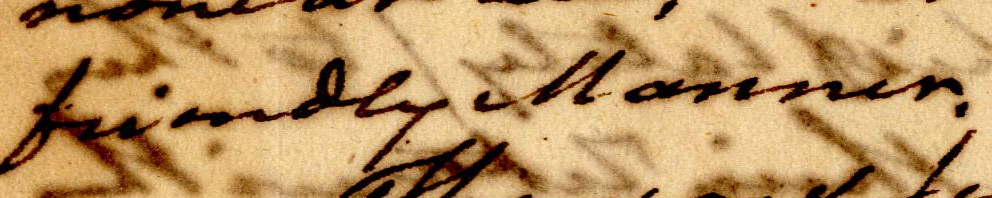friendly Manner.
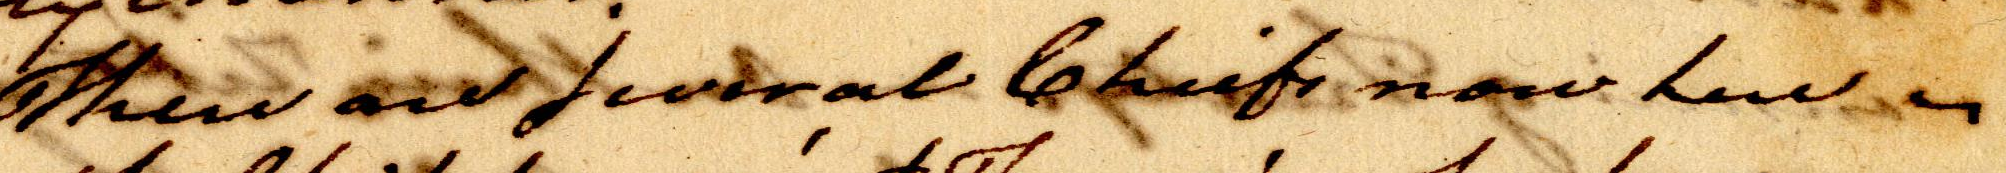There are several Chiefs now here-
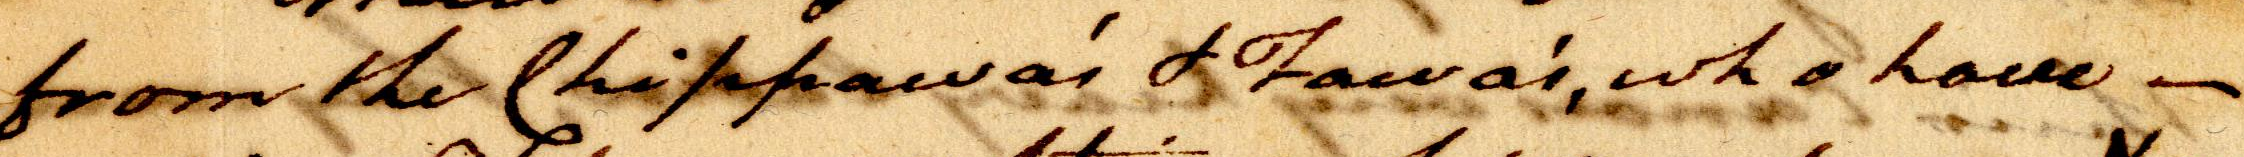from the Chippawa's & Tawa's, who have-
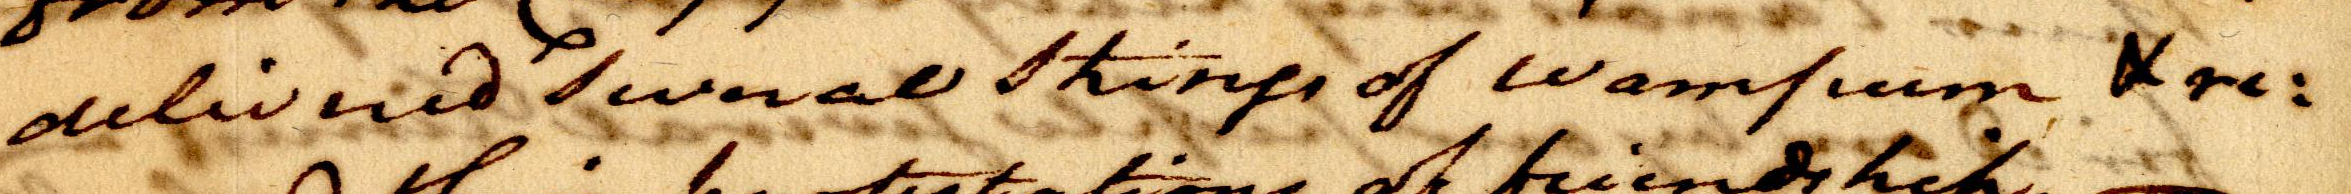delivered several strings of wampum, & re-
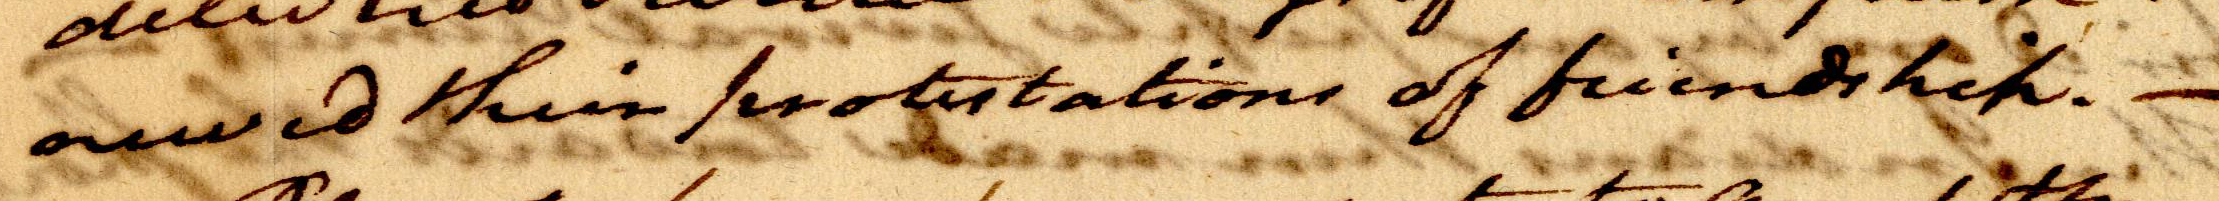newed their protestations of friendship.-
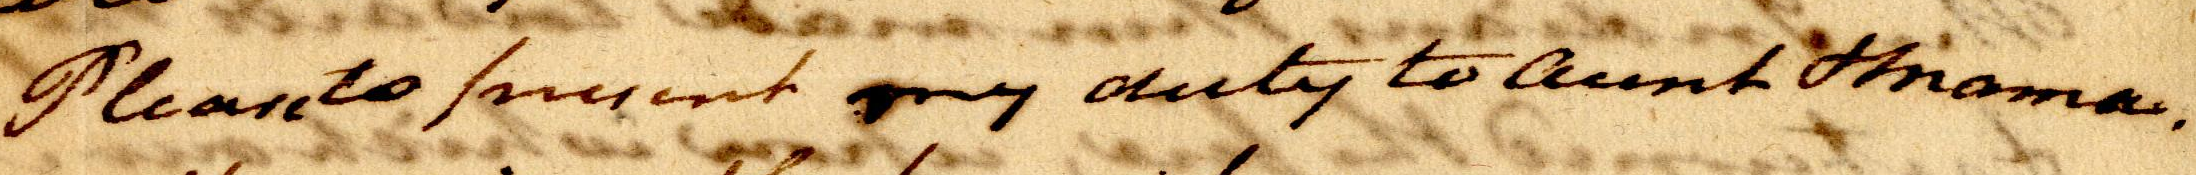Please to present my duty to Aunt & Mama.
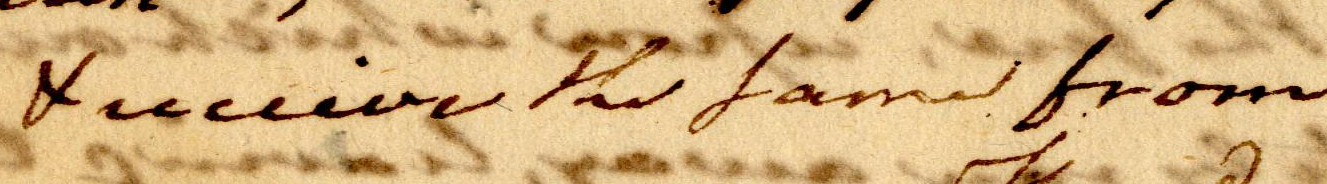& receive the same from
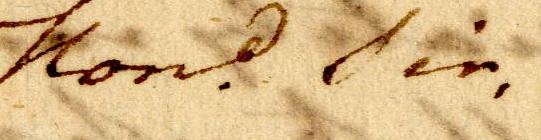Hon^d. Sir,
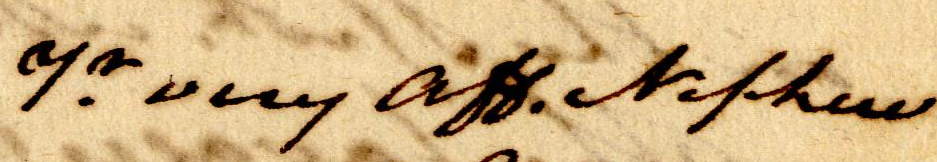Y^r. very Aff. Nephew
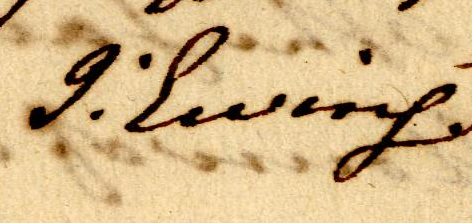J: Ewing.
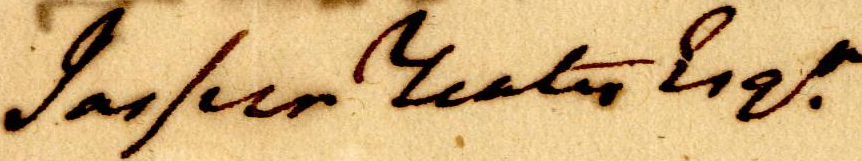Jasper Yeats Esq.
